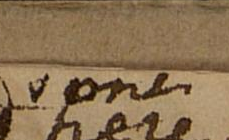some
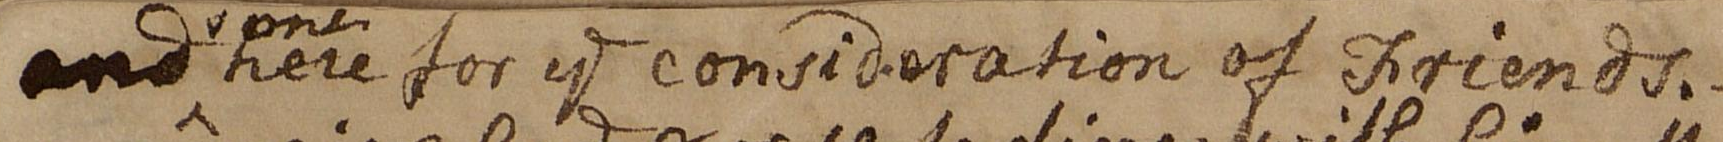and ^ here for y^e consideration of Friends.
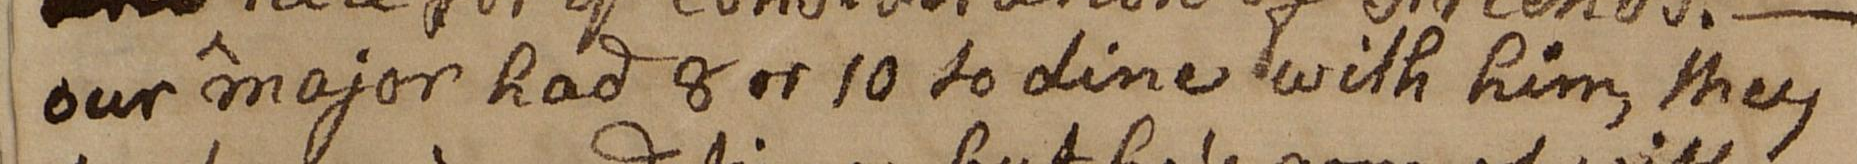our major had 8 or 10 to dine with him, they
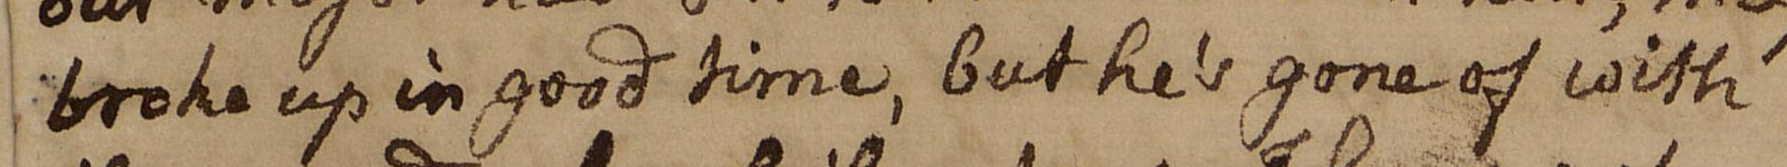broke up in good time, but he's gone of with
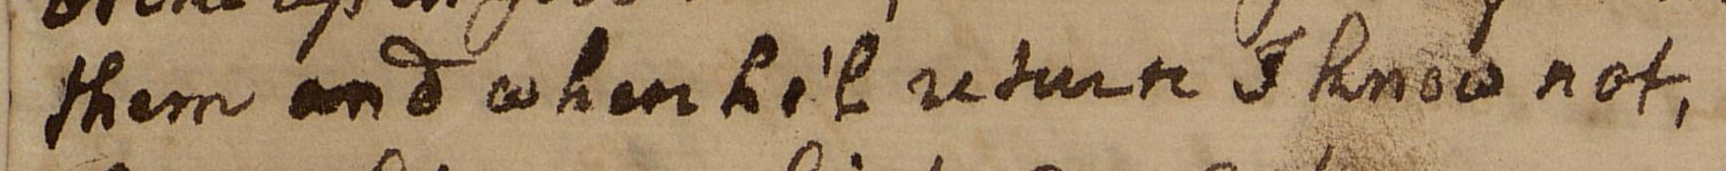them and when he'l return I know not,
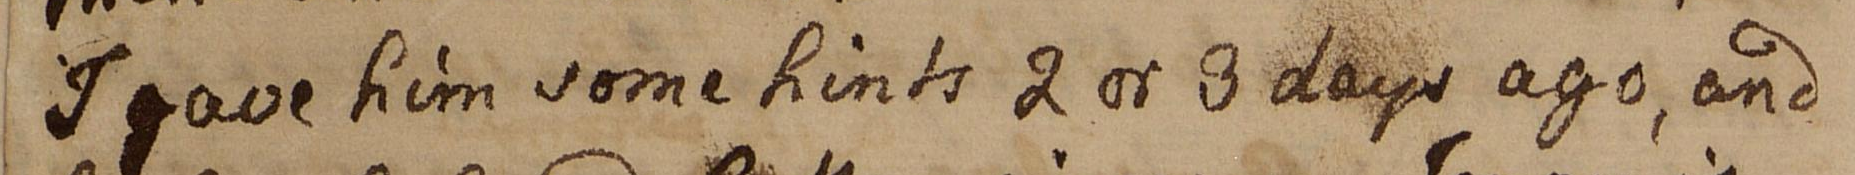I gave him some hints 2 or 3 days ago, and
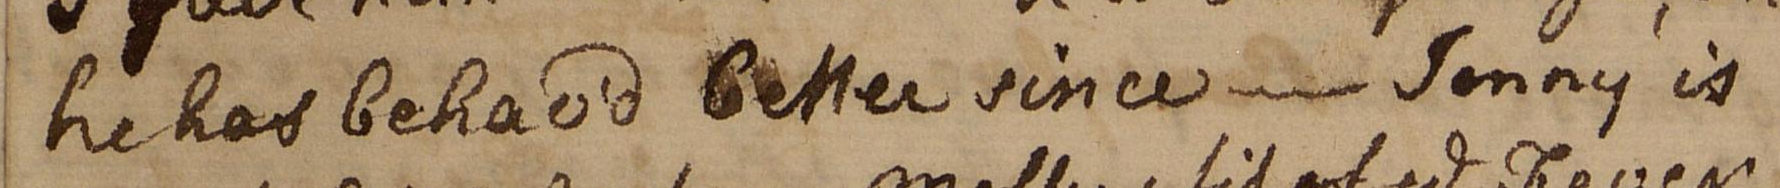he has behav'd better since- Janny is
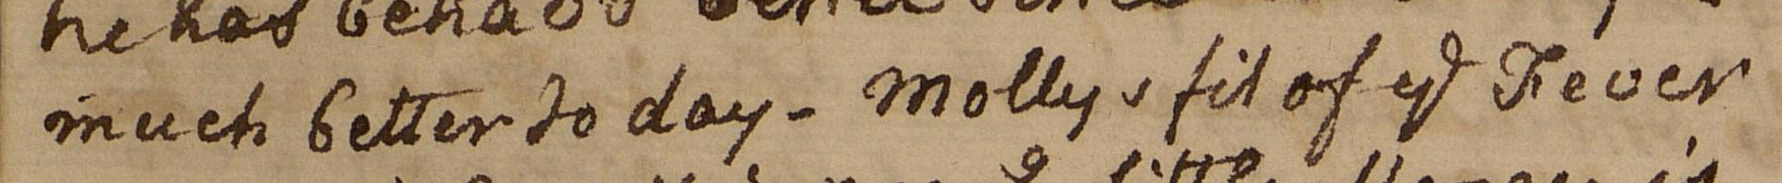much better to day- Mollys fit of y^e Fever
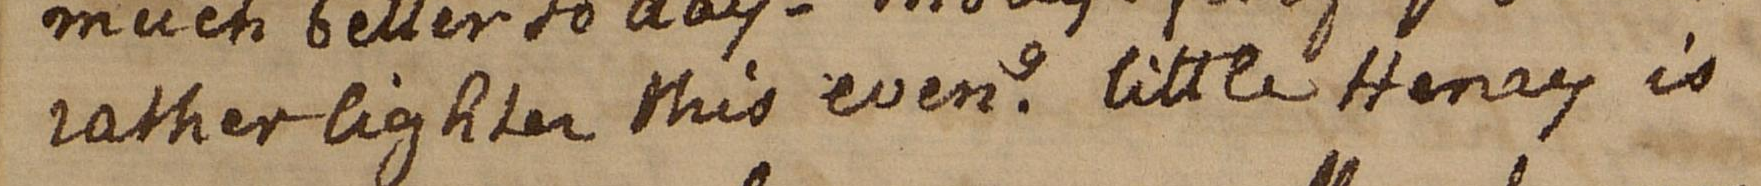rather lighten this even^g. little Henry is
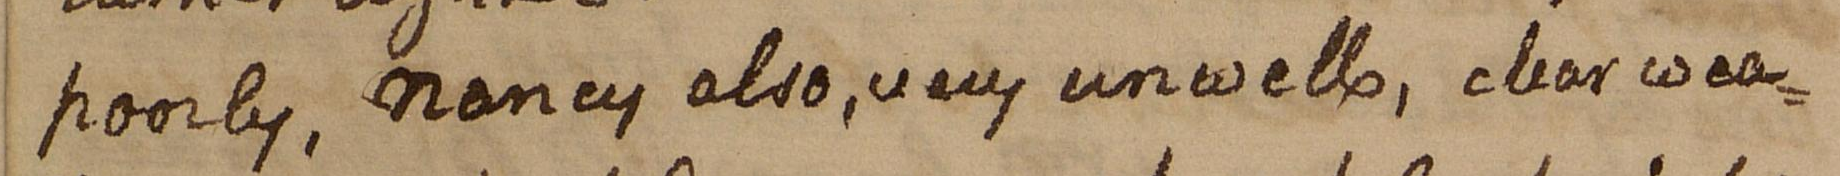poorly, Nancy also, very unwell, clear wea-
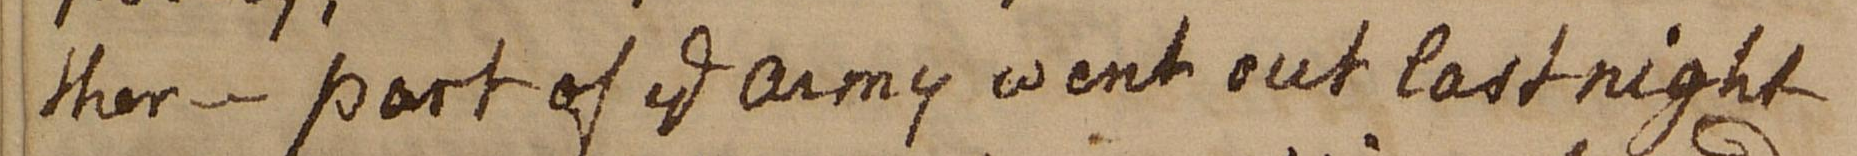ther- part of y^e army went out last night
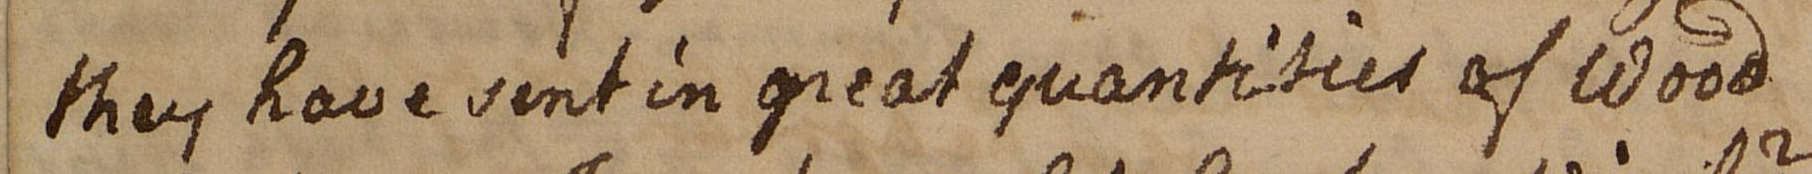they have sent in great quantities of Wood
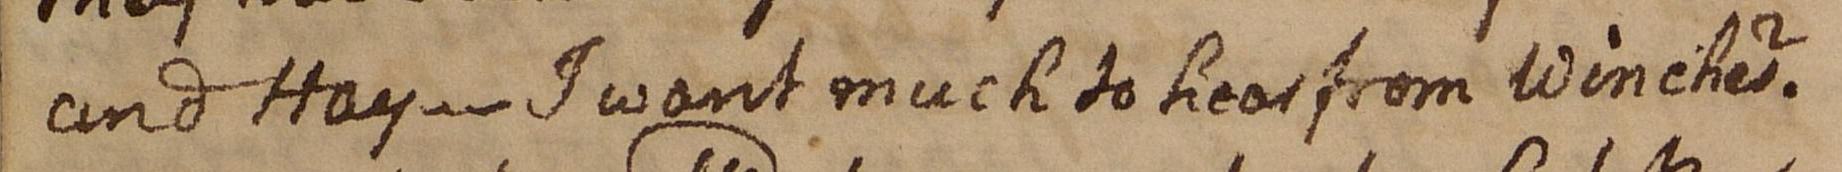and Hay- I want much to hear from Winches^r.
